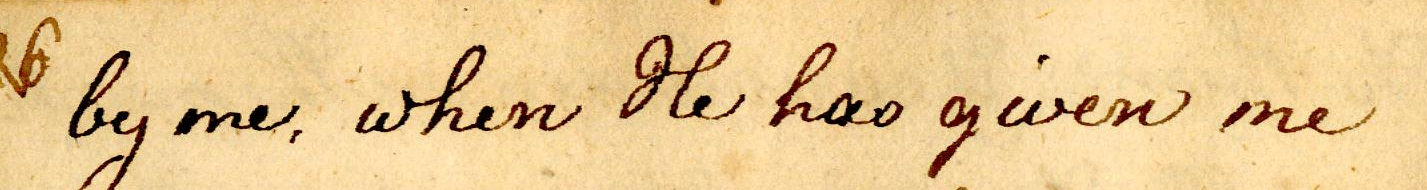by me, when He has given me
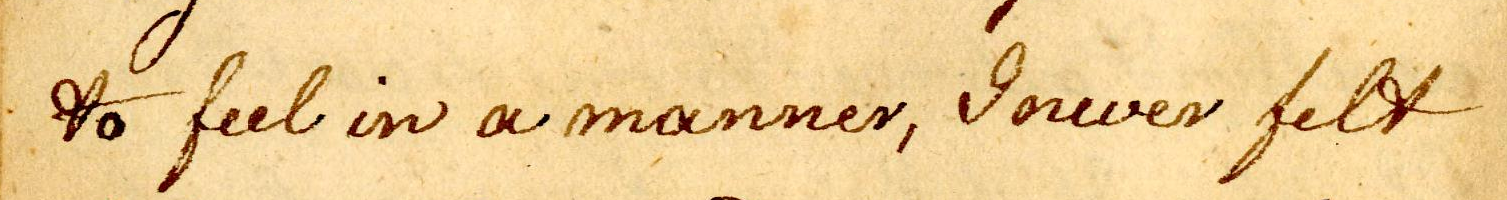to feel in a manner, I never felt
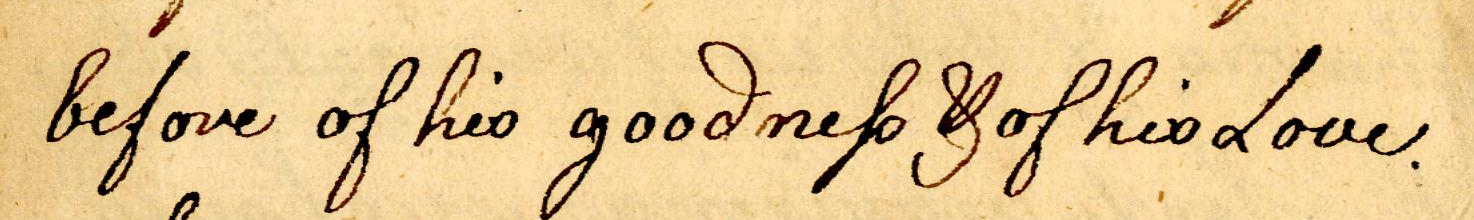before of his goodness & of his Love.
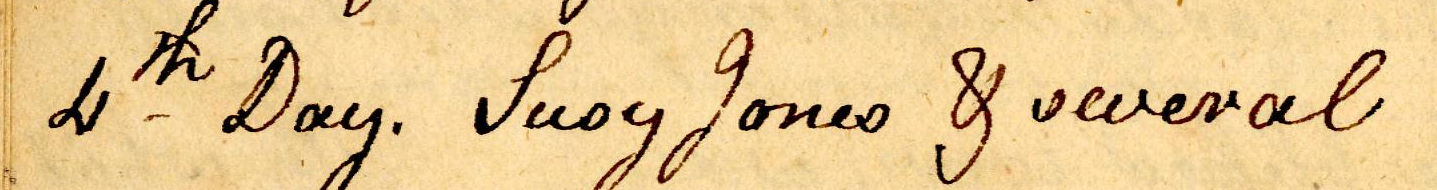4^th Day. Susy Jones & several
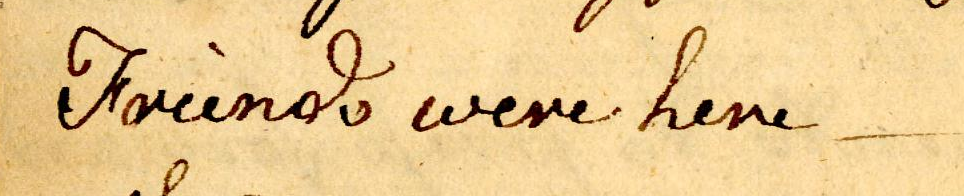Friends were here-
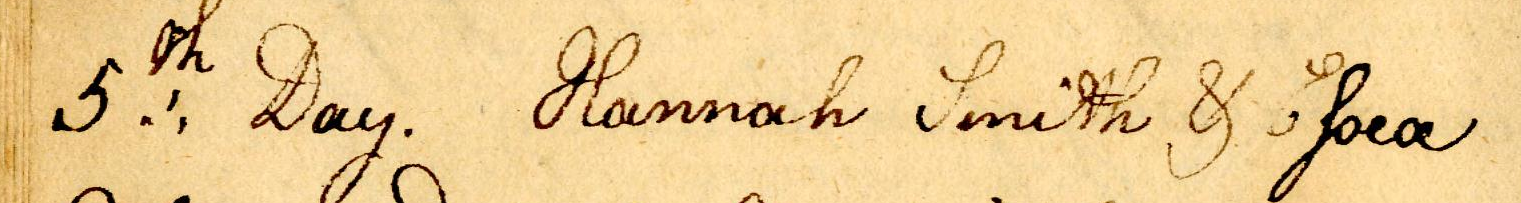5^th Day. Hannah Smith & Essea
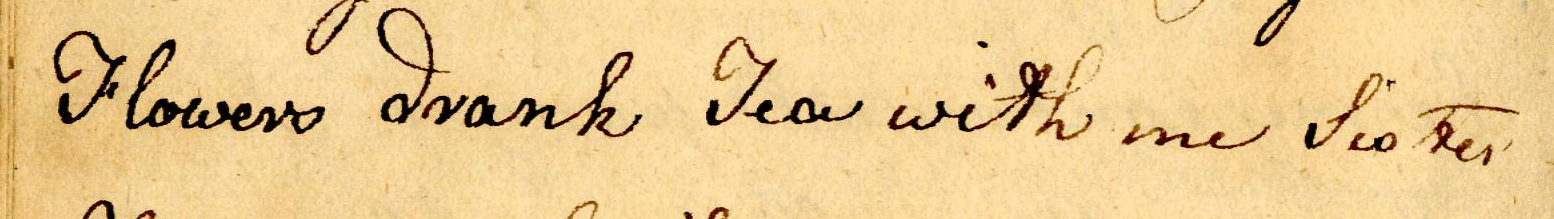Flowers drank Tea with me Sister
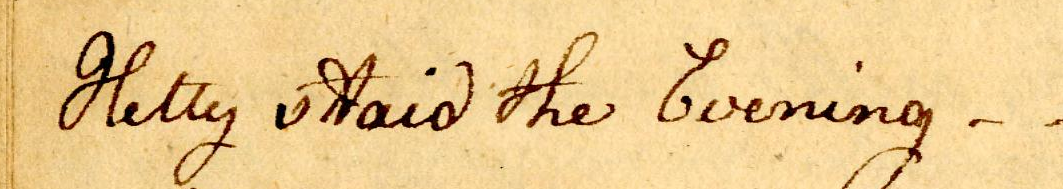Hetty staid the Evening -
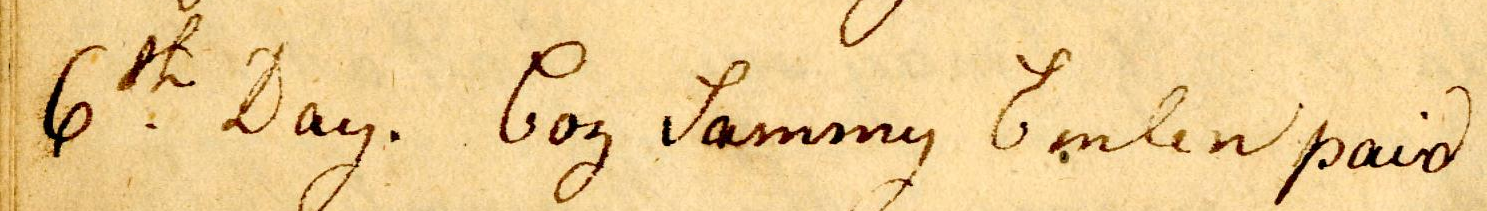6^th Day. Coz Sammy Emlen paid
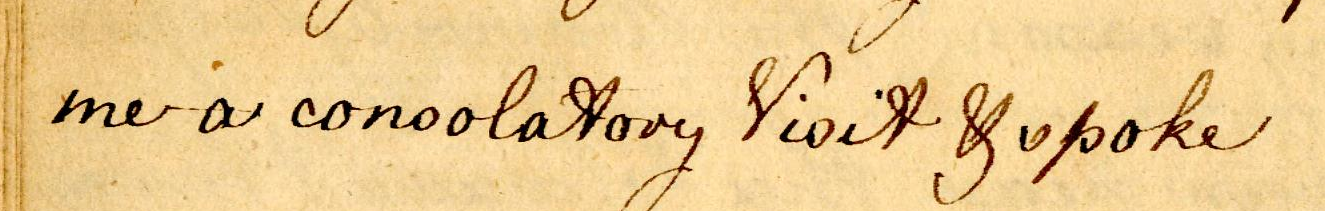me a consolatory Visit & spoke
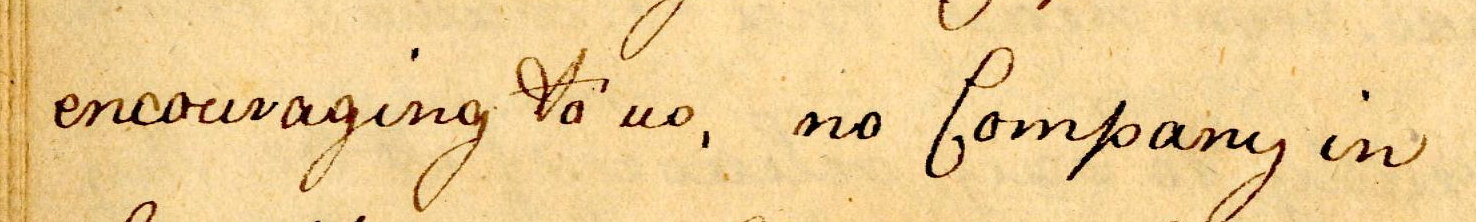encouraging to us, no Company in
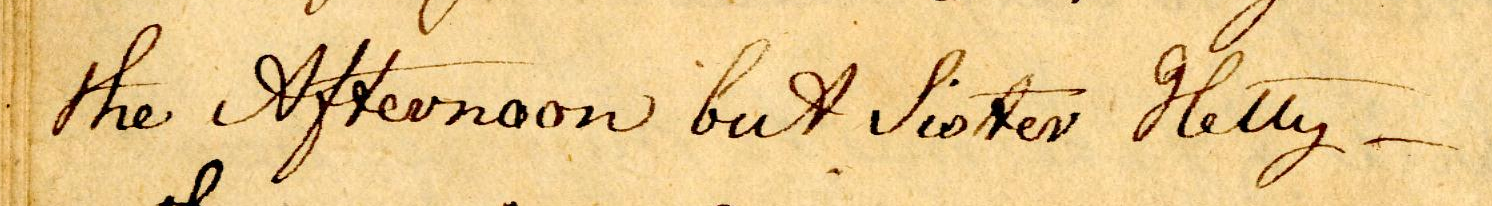the Afternoon but Sister Hetty-
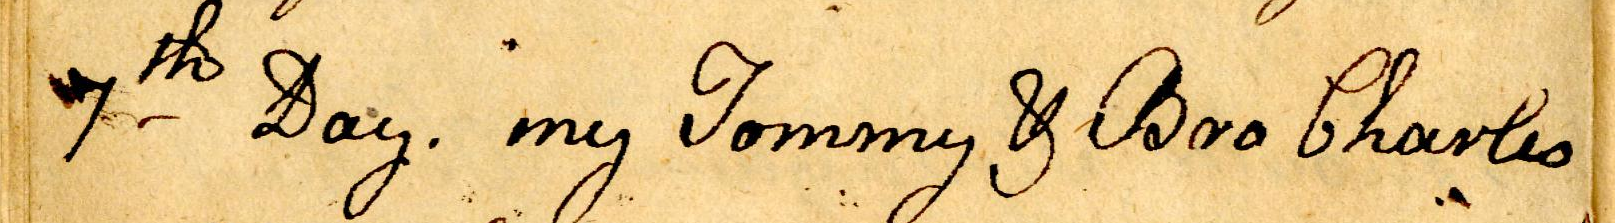7^th Day. my Tommy & Bro Charles
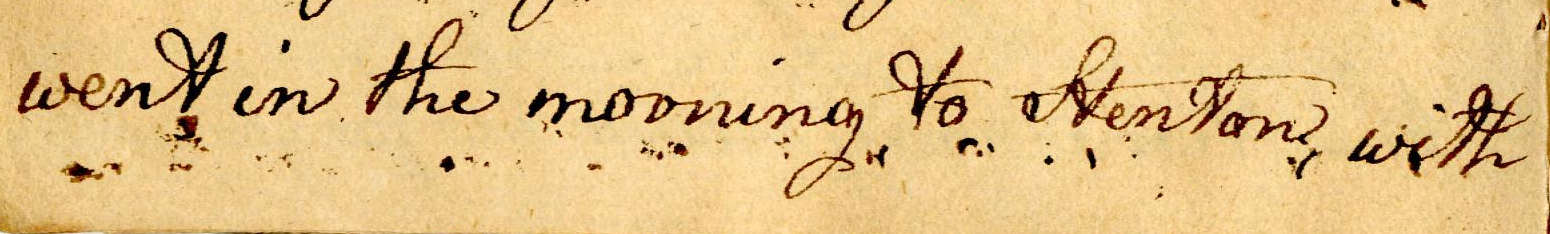went in the morning to Stenton, with
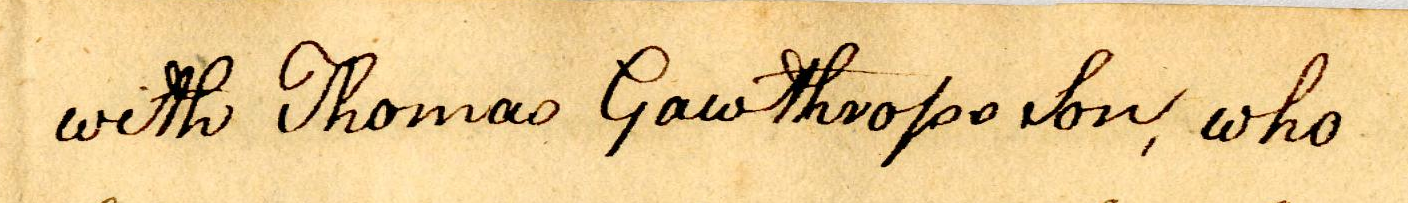with Thomas Gawthropes Son, who
